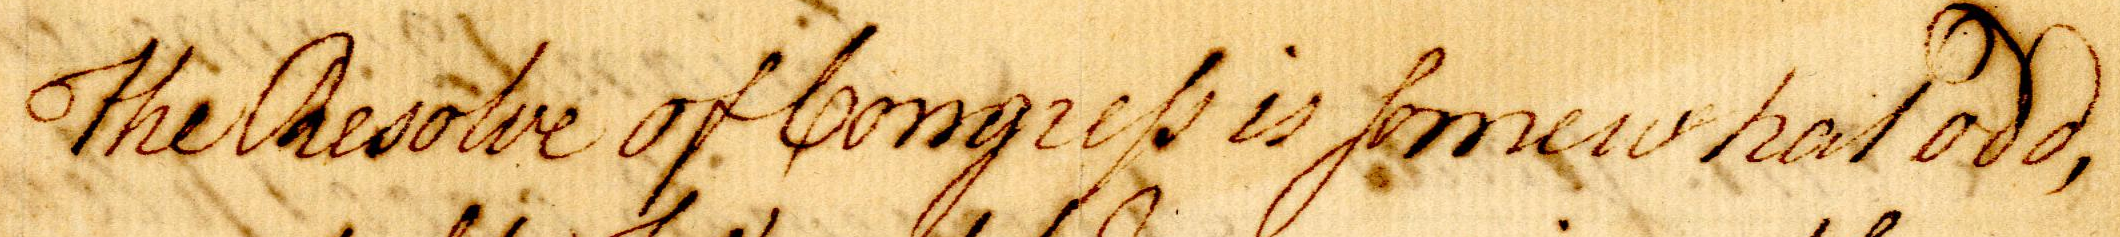The Resolve of Congress is somewhat odd
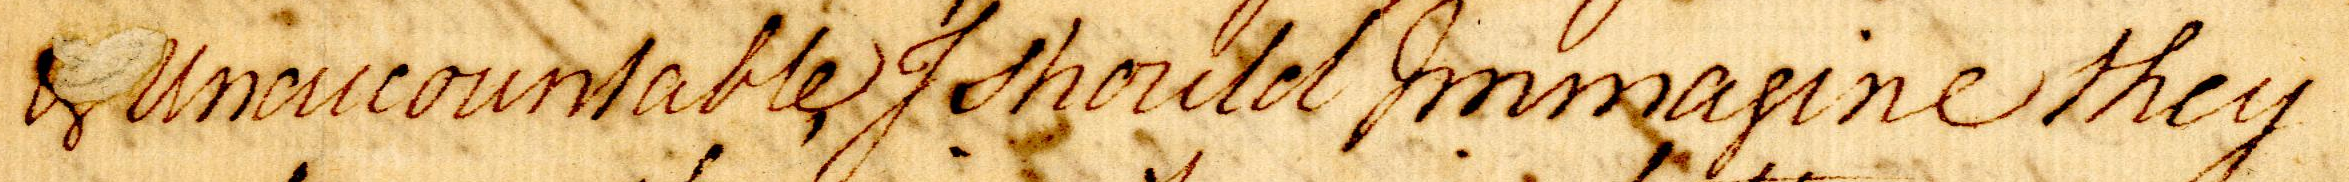& Unaccountable I should Immagine they
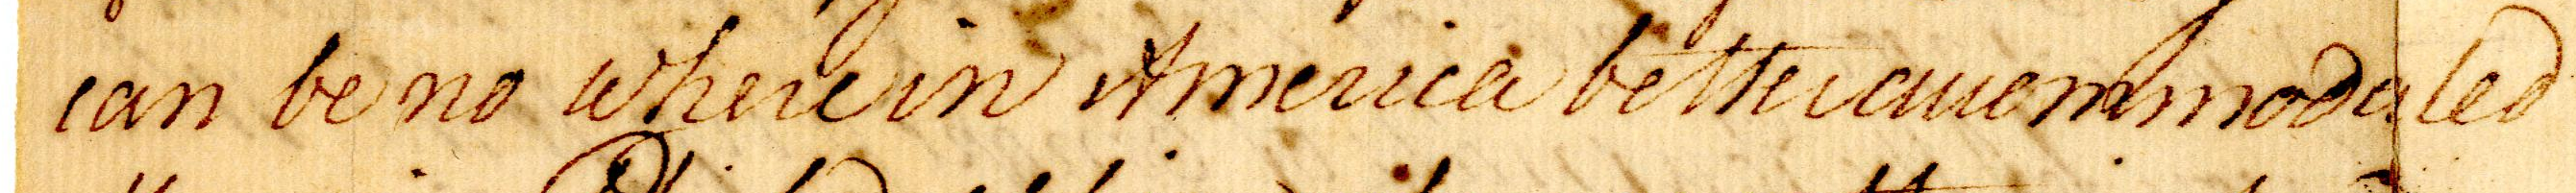can be no where in America better accommodated
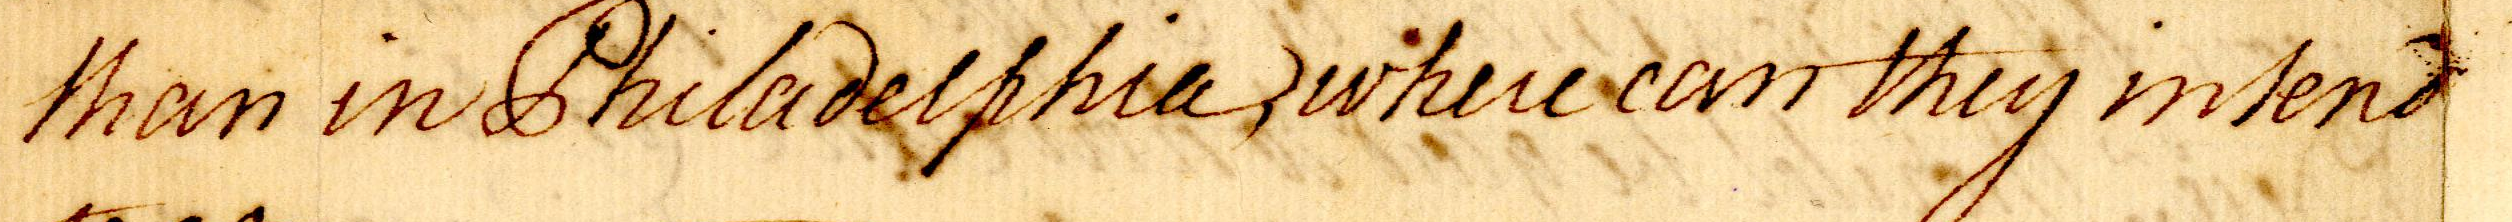than in Philadelphia, where can they intend
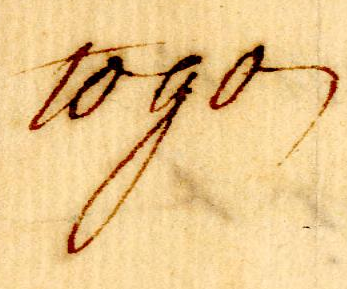to go
